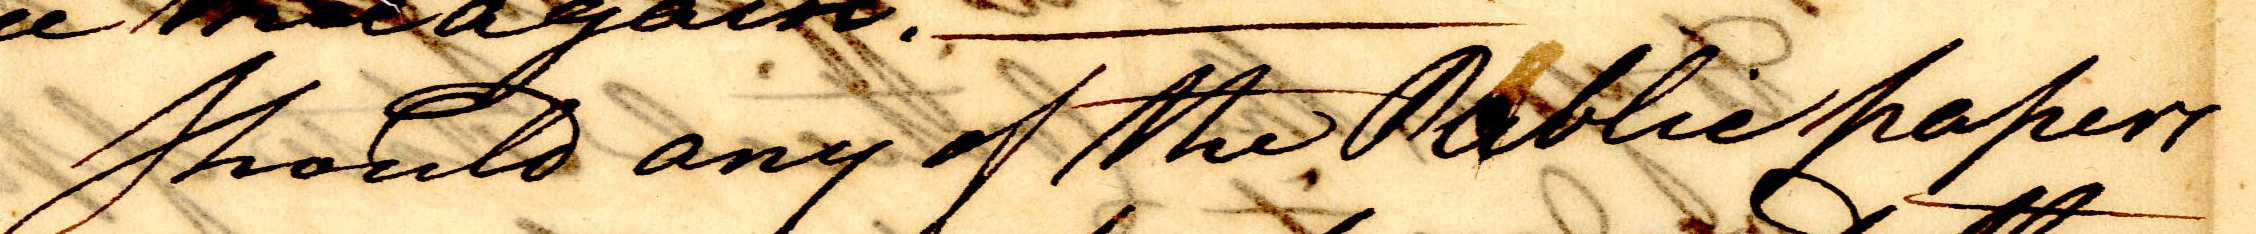Should any of the Public papers
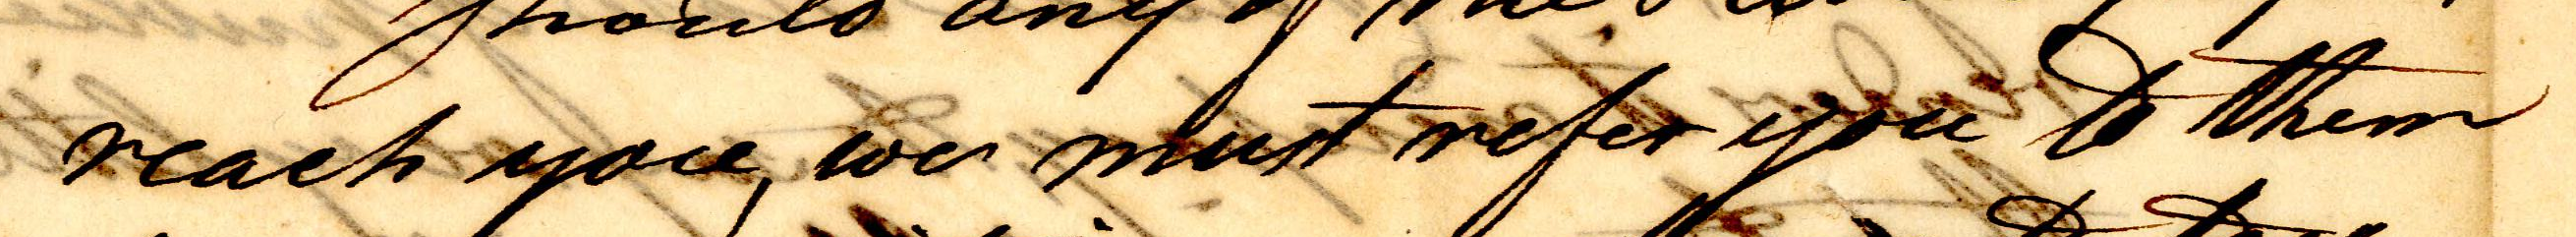reach you, we must refer you to them
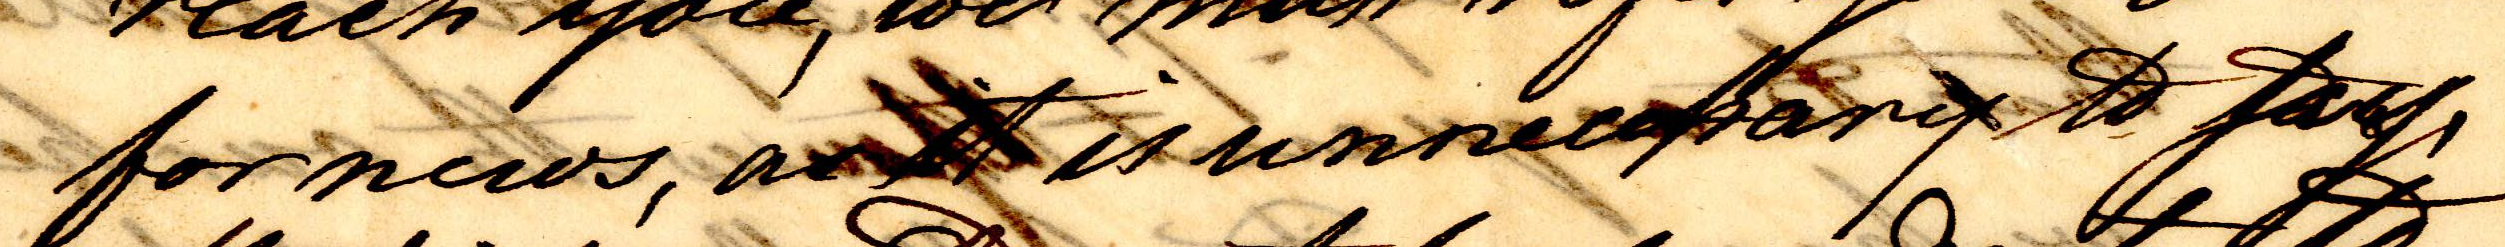for news, as it is unnecessary to say,
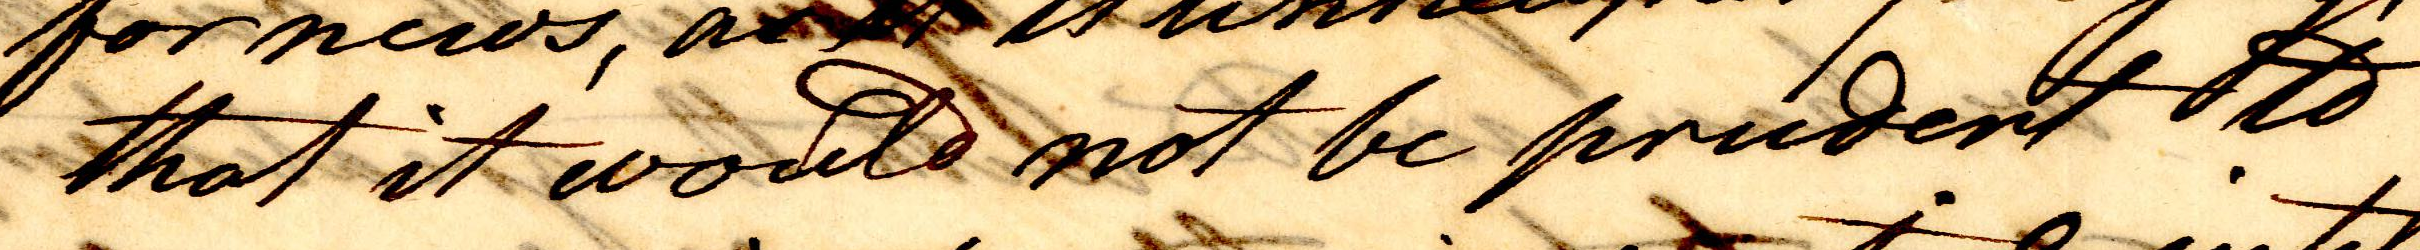that it would not be prudent to
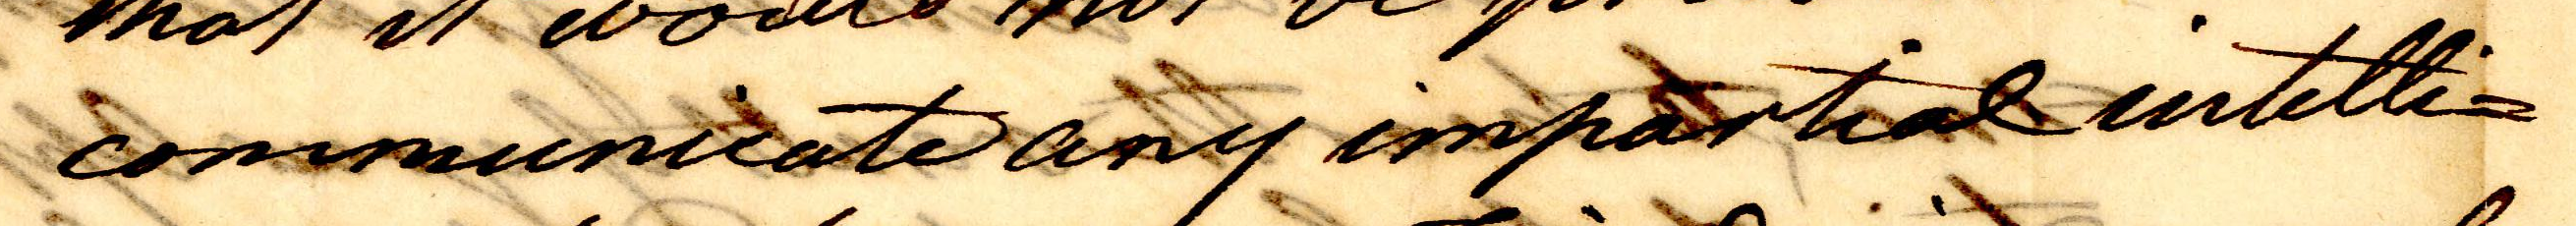communicate any impartial intelli-
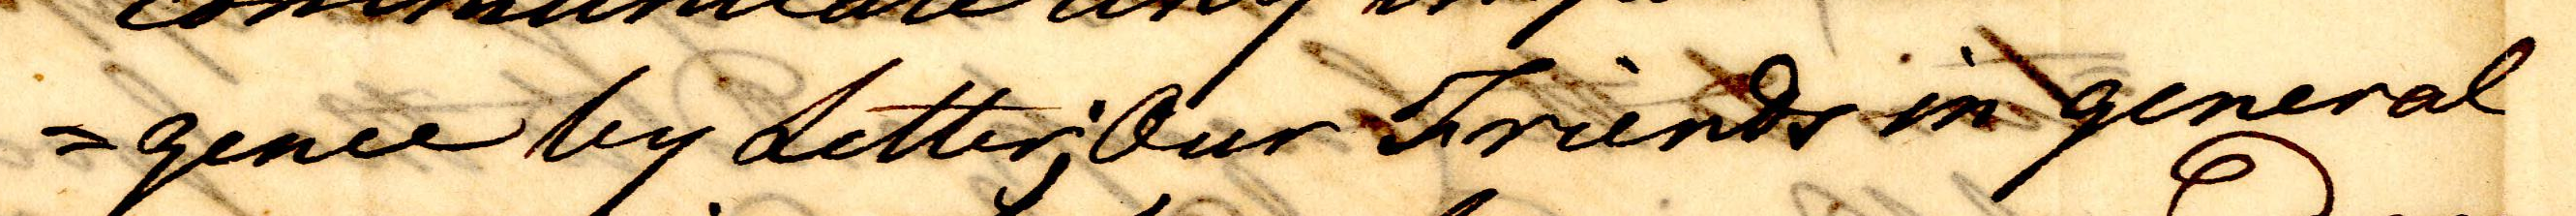-gence by Letter; Our Friends in general
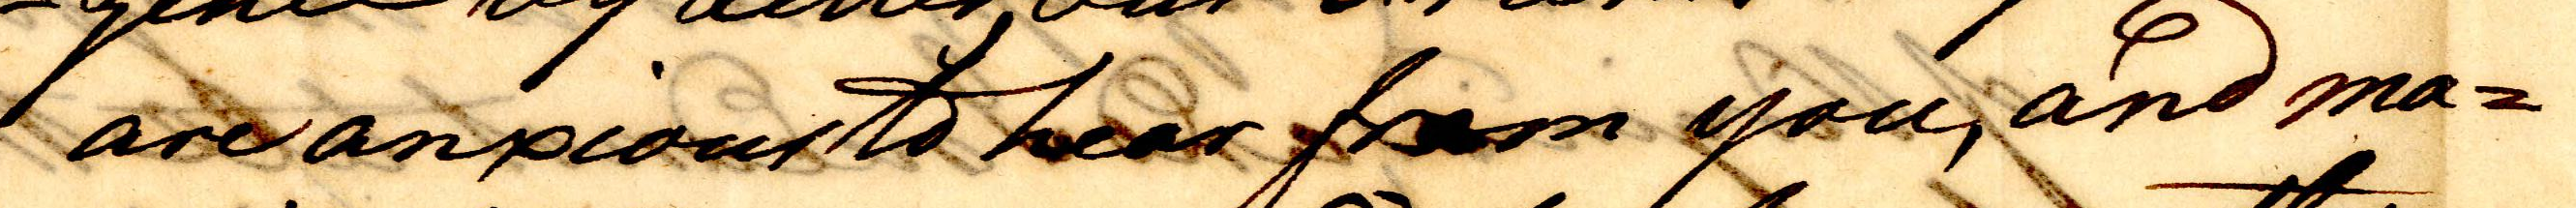are anxious to hear from you, and ma-
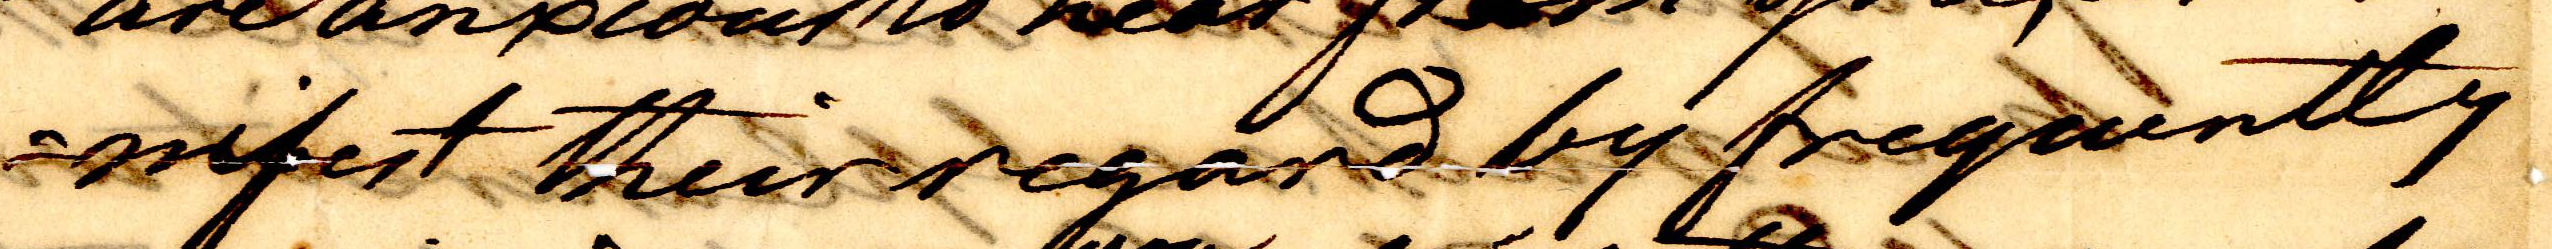-nifest their regard by frequently
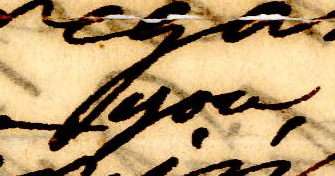you
